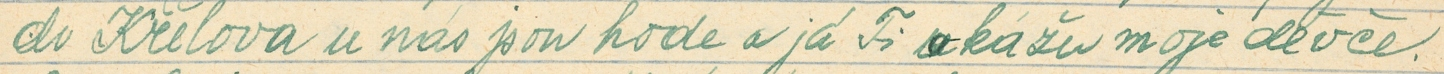do Křelova u nás jsou hode a já Ti ukážu moje děvče.
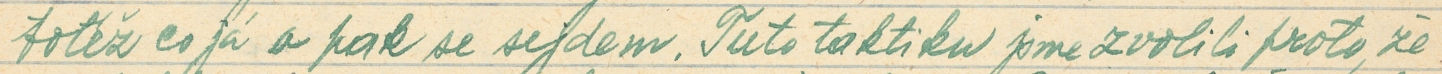totéž co já a pak se sejdem. Tuto taktiku jsme zvolili proto, že
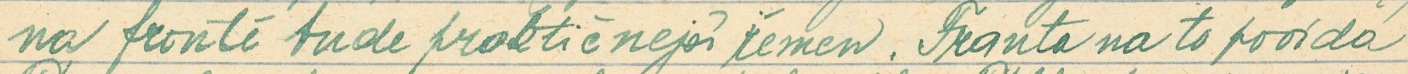na frontě bude praktičnejší řemen. Franta na to povídá
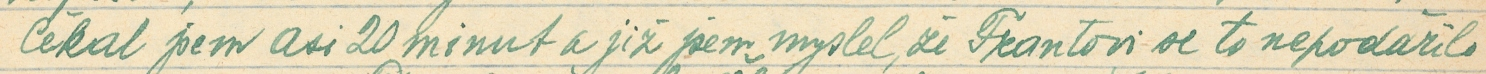Čekal jsem asi 20 minut a již jsem myslel, že Frantovi se to nepodařilo
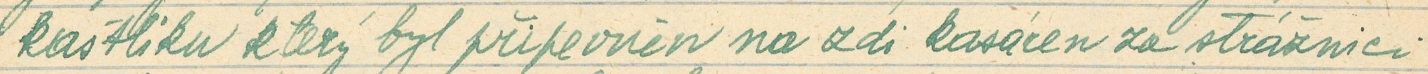kastlíku který byl připevněn na zdi kasáren za strážnici
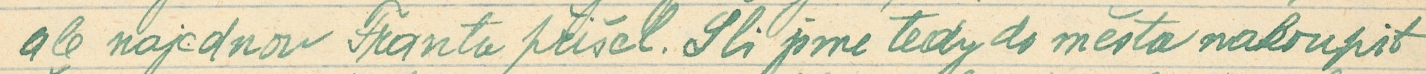ale najednou Franta přišel. Šli jsme tedy do města nakoupit
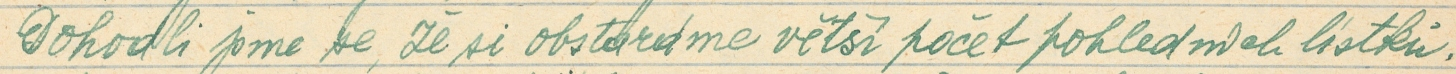Dohodli jsme se, že si obstaráme větší počet pohledních lístků.
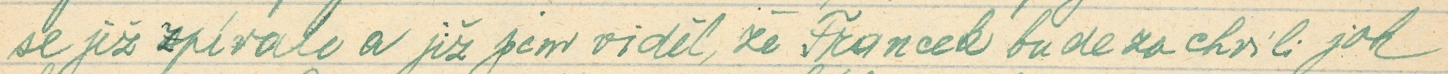se již zpívalo a již jsem viděl, že Francek bude za chvíli jak
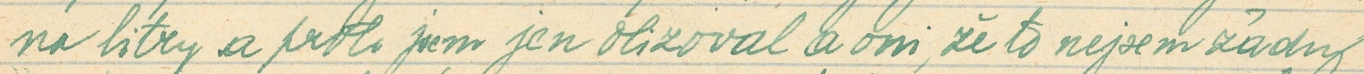na litry a proto jsem jen olizoval a oni, že to nejsem žádný
